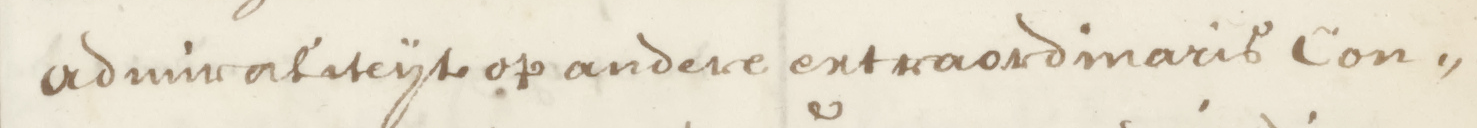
admiraliteijt op andere extraordinaris Con„
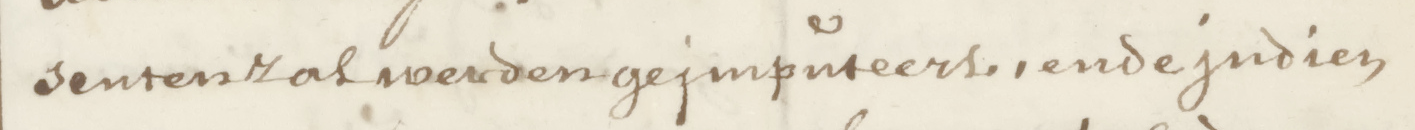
senten zal werden geimputeert, ende Indien
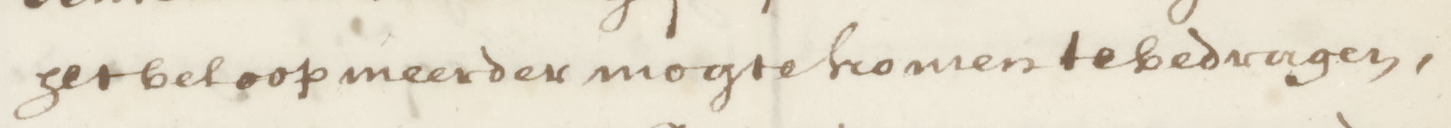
het beloop meerder mogte komen te bedragen,
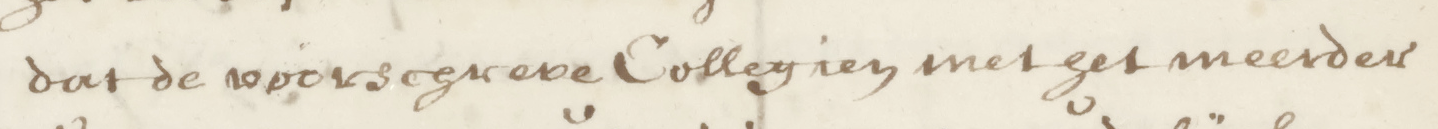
dat de voorschreve Collegien met het meerder
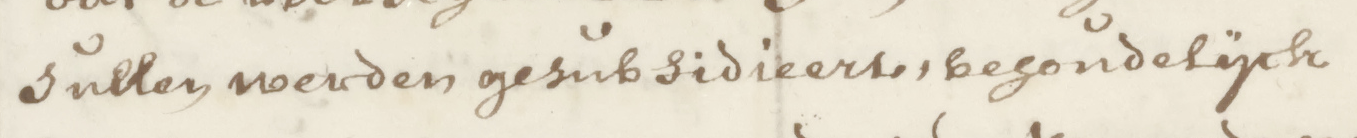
sullen werden gesusidieert, behoudelijck
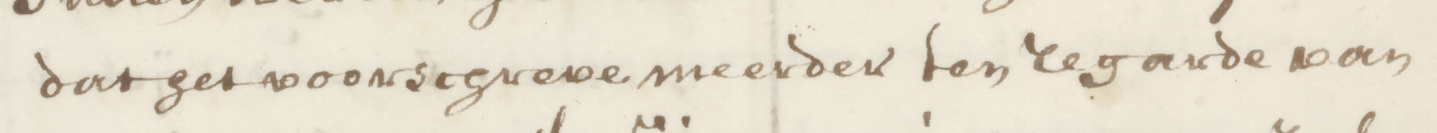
dat het voorschreve meerder ten regarde van
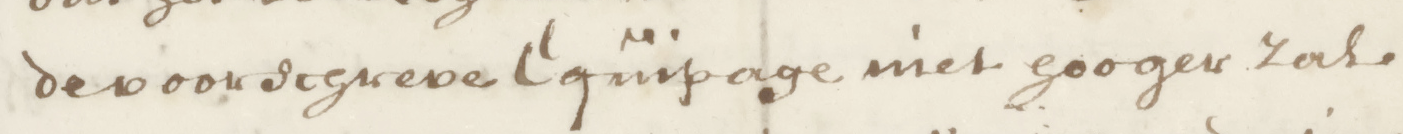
de voorschreve Equipage niet hooger zal
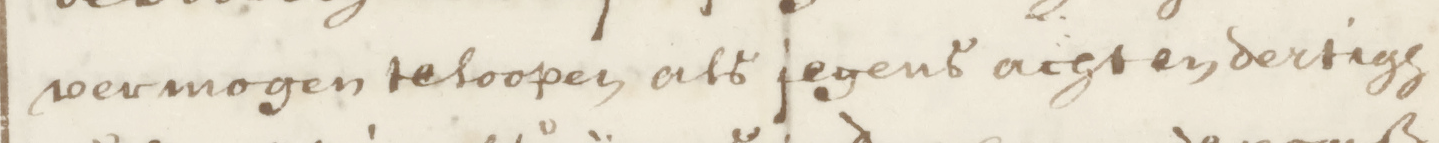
vermogen te loopen als jegens achtendertigh
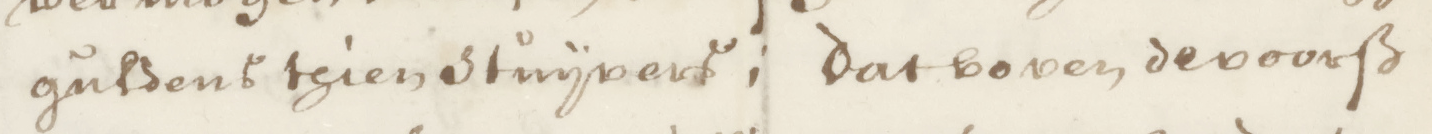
guldens thien Stuijvers; dat boven de voors
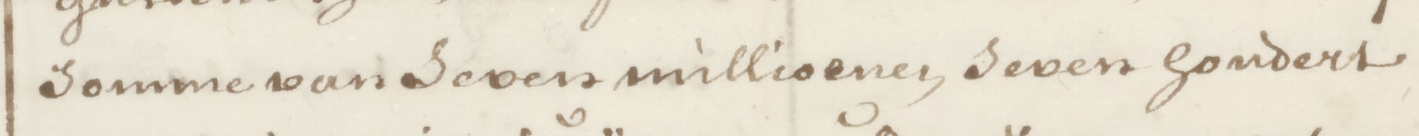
somme van Seven millioenen, Seven hondert
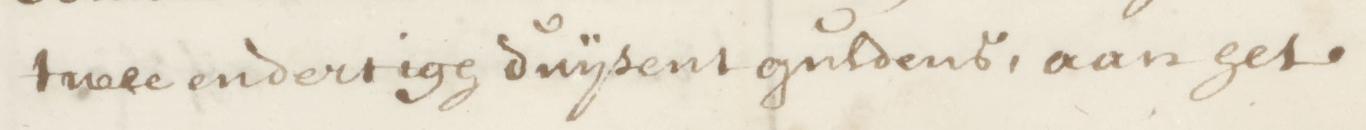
twee endertigh duijsent guldens, aan het
